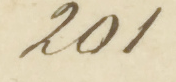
201
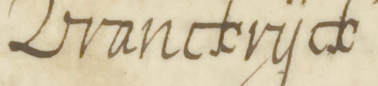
Vranckrijck
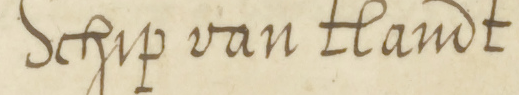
Schip van tlandt
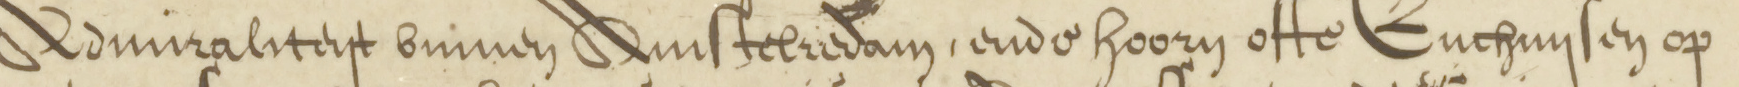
Admiraliteyt binnen Amstelredam, ende hoorn ofte Enchuysen op
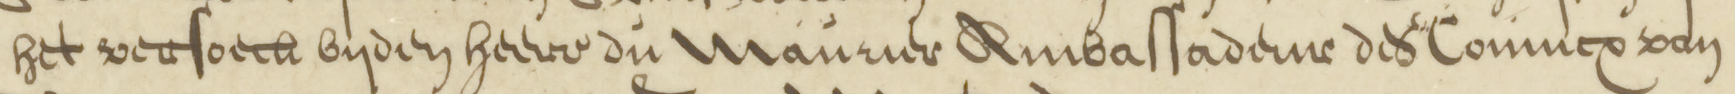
het versoeck byden heere du Maurier Ambassadeur des Conincx van
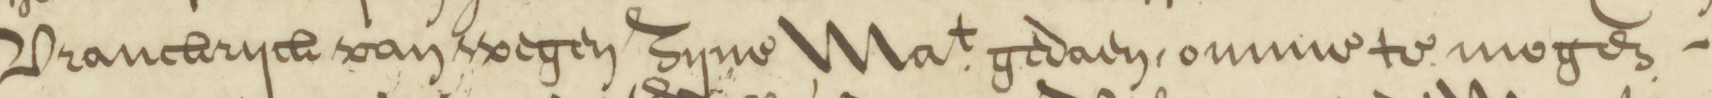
Vranckryck van wegen zyne Mat. gedaen, omme te mogen -
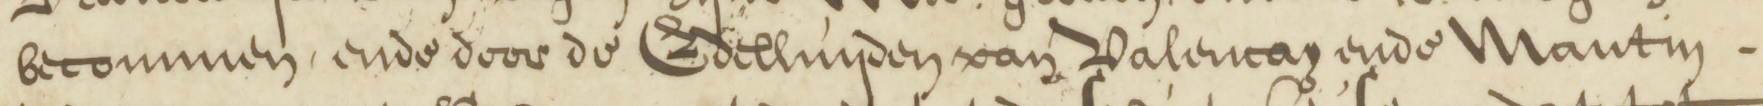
becommen, ende door de Edelluyden van Valencay ende Mantin
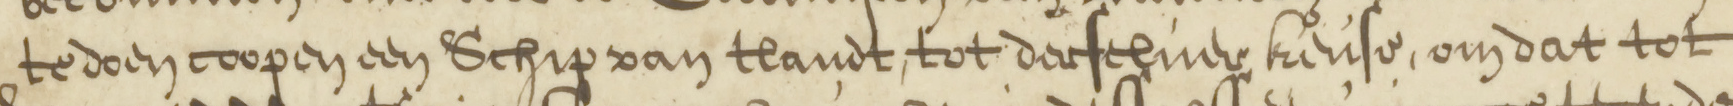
te doen coopen een Schip van tlandt, tot derseluer keuse, om dat tot
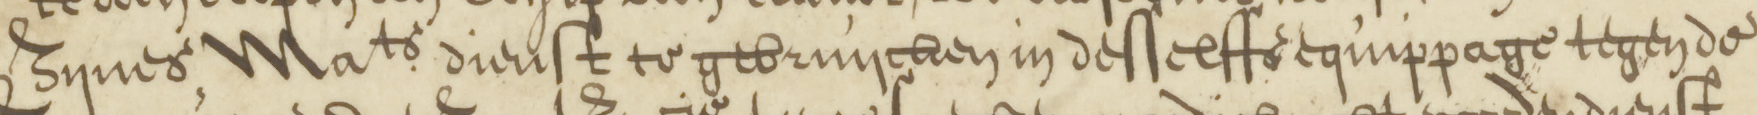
Zynes Mats. dienst te gebruycken in desselffs equippage tegen de
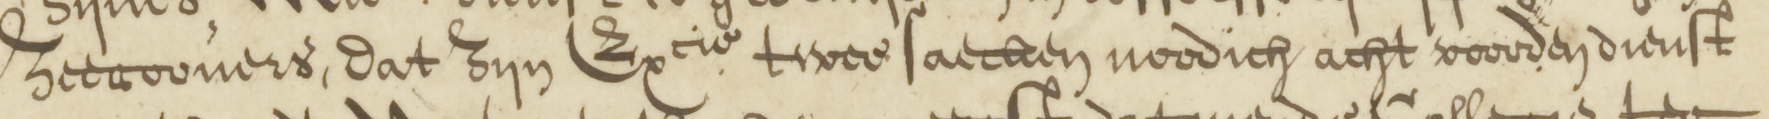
Zeeroouers, dat Zijn Excie. twee saecken noodich acht voorden dienst
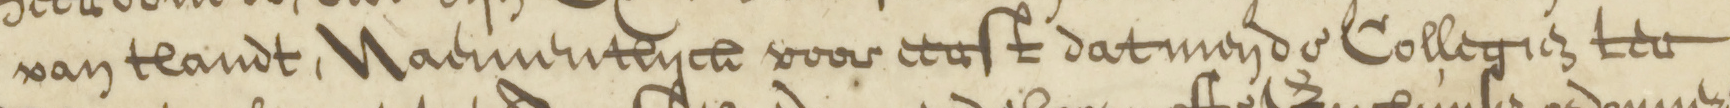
van tlandt, Naementlyck voor eerst dat men de Collegien ter
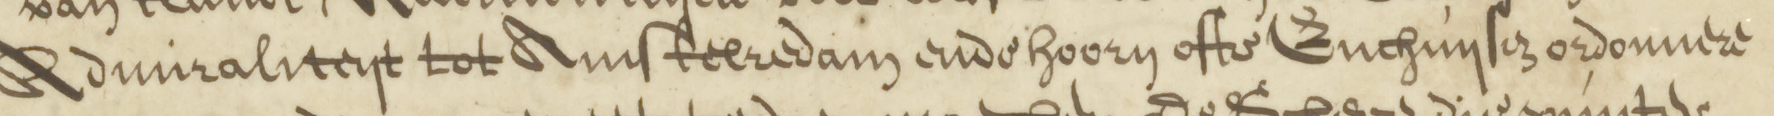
Admiraliteyt tot Amstelredam ende hoorn ofte Enchuysen ordonnere
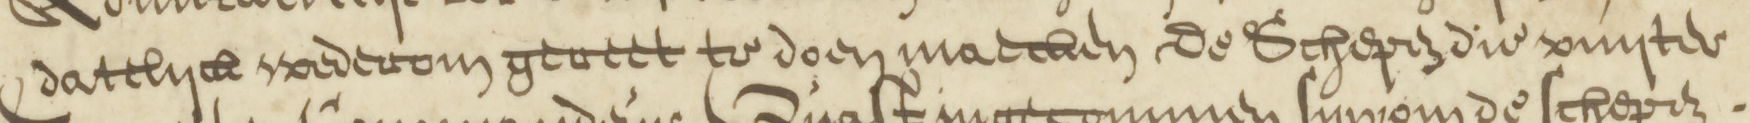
datelyck wederom gereet te doen maecken de Schepen die vuyter
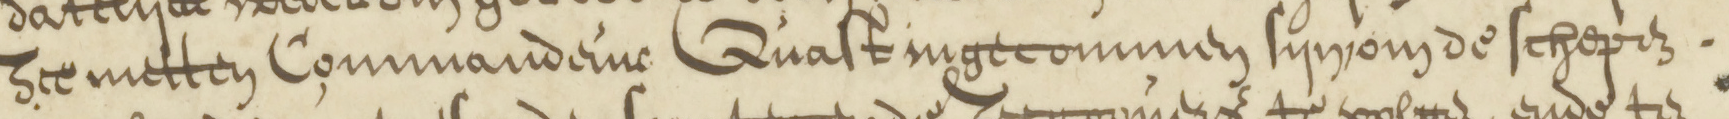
Zee metten Commandeur Quast ingecommen syn, om de schepen
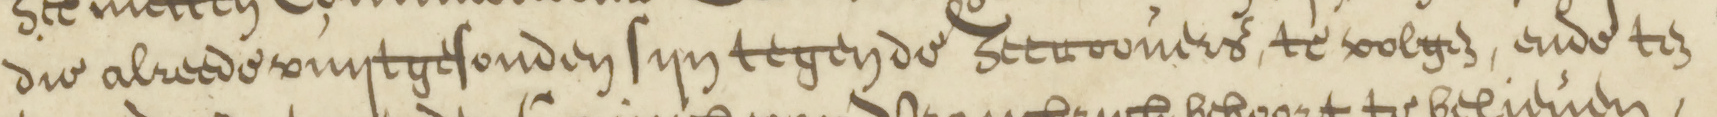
die alreede vuytgesonden syn tegen de Zeeroouers, te volgen, ende ten
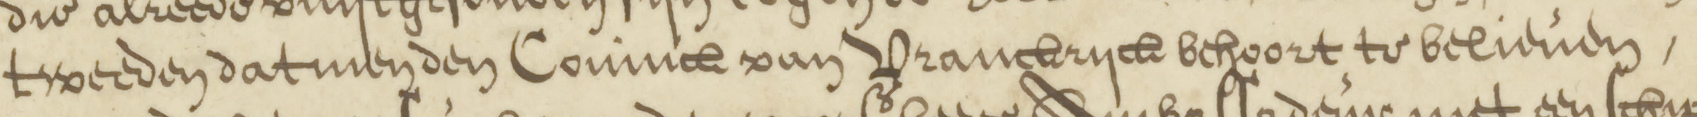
tweeden dat men den Coninck van Vranckryck behoort te belieuen,
